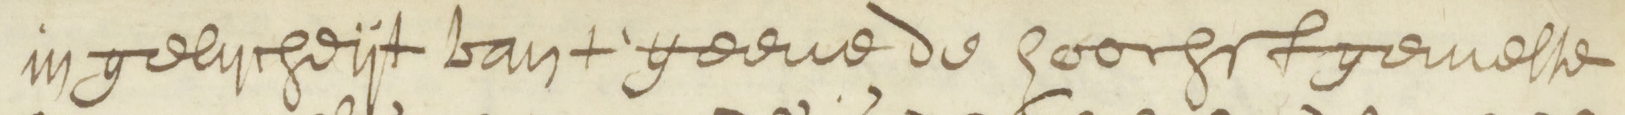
in gelycheijt van t'geene de hoochstgemelte
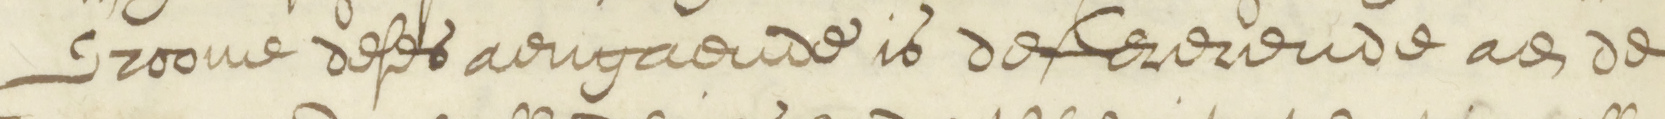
Croone deses aengaende is defererende aen de
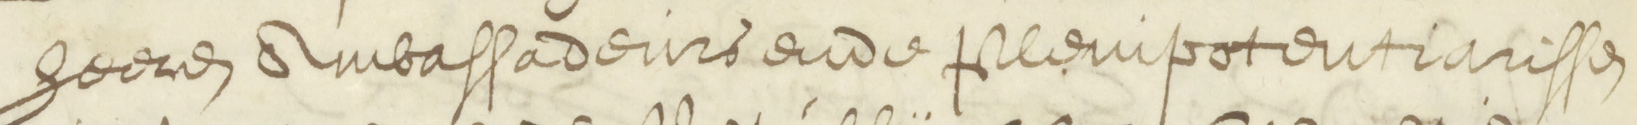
heeren Ambassadeurs ende Plenipotentiarissen
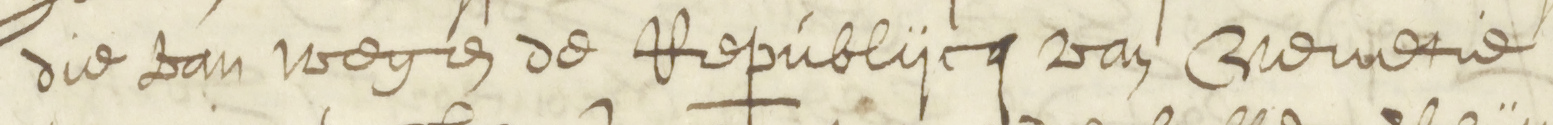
die van wegen de Republijcq van Venetie
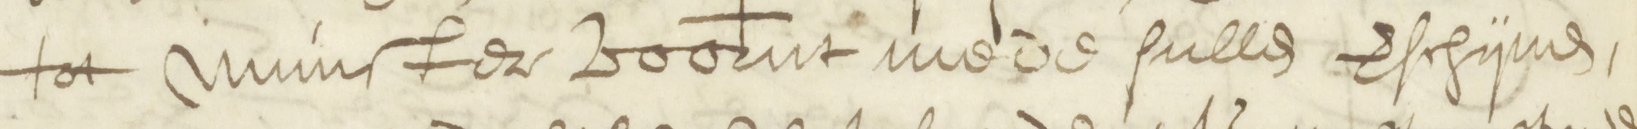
tot Munster voornt mede sullen vschynen.
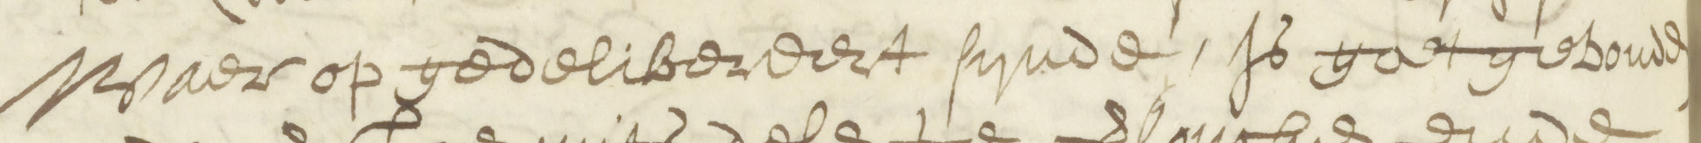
Waer op gedelibereert sijnde, Is goetgevonden
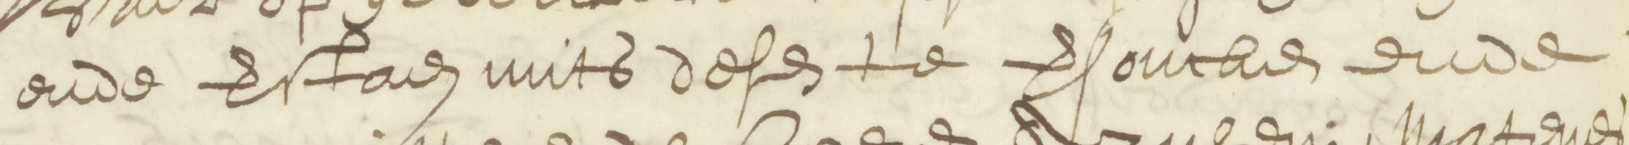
ende vstaen mits desen te vsoucken ende
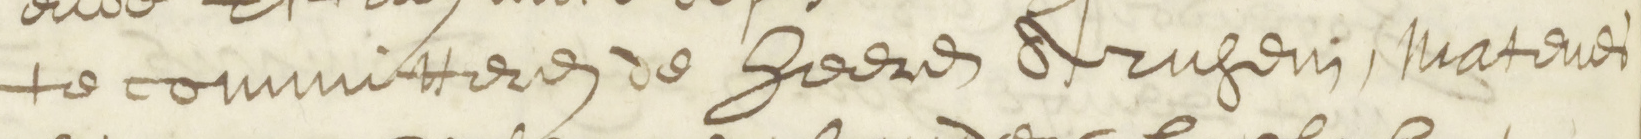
te committeren de heeren Arnhem, Matenes
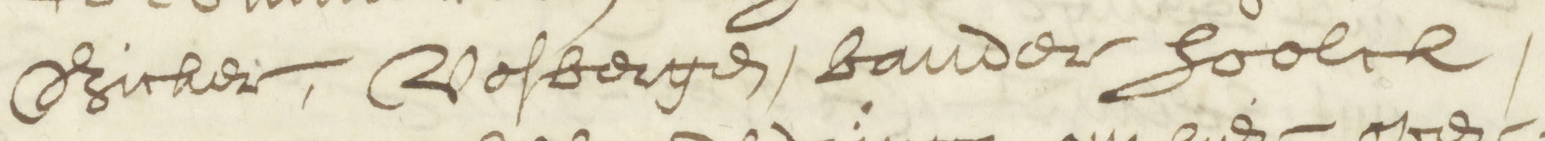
Bicker, Vosbergen, vander hoolck,
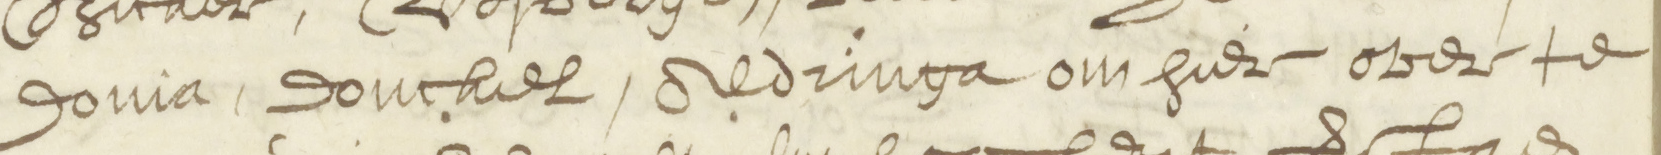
Donia, Donckel, Aldringa om hier over te
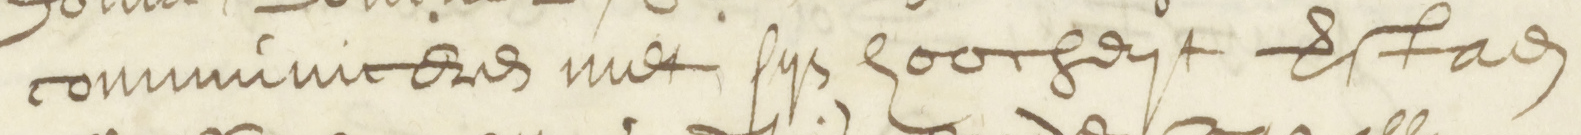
commmuniceren met syn hoocheyt vstaen
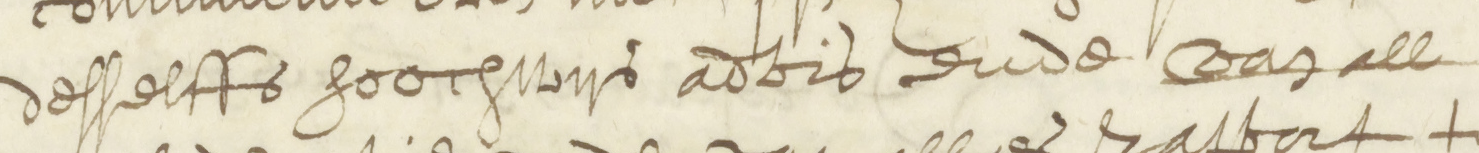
desselffs hoochwys advis ende van all
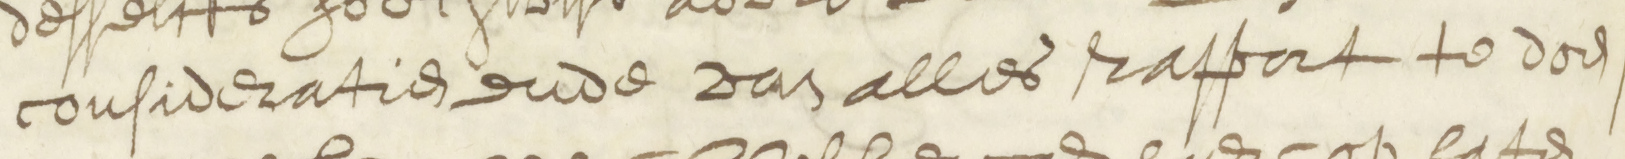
consideratien ende van alles rapport te doen.
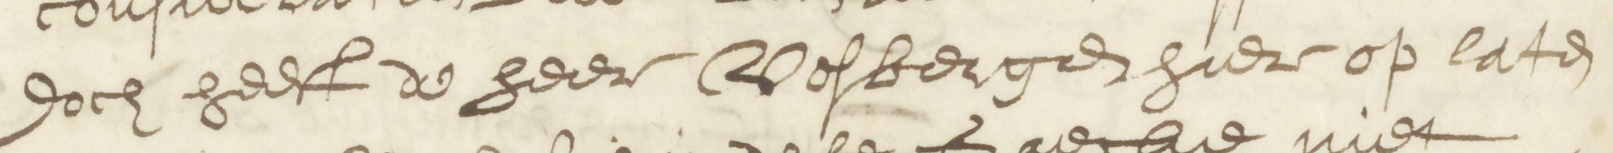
Doch heeft de heer Vosbergen hier op laten
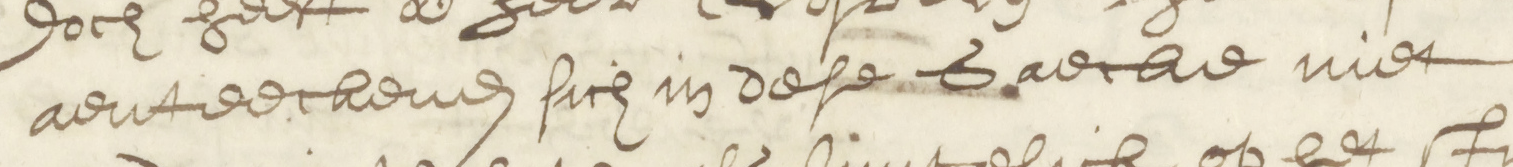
aenteeckenen sich in dese saecke niet
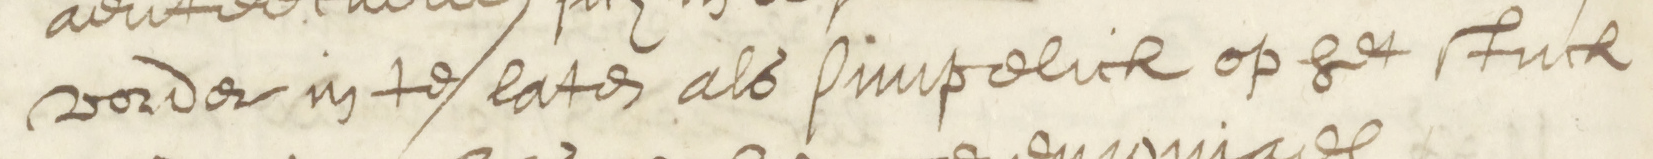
vorder in te laten als simpelick op het stuck
